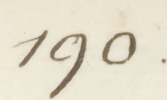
190.
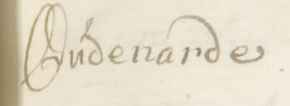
Oudenarde
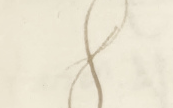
Ca.
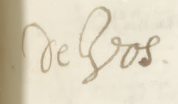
de Vos
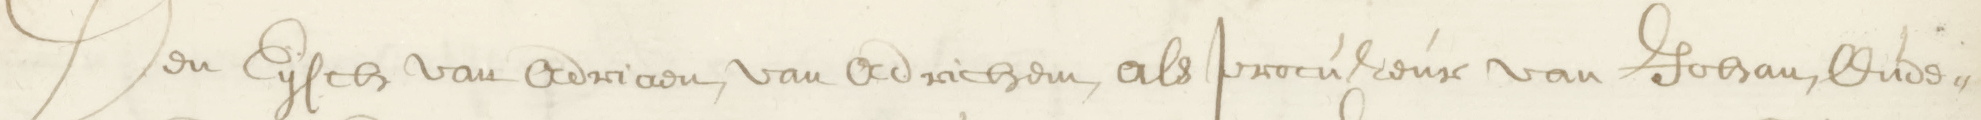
Den Eijsch van Adriaen van Adrichem als procureur van Johan Oude„
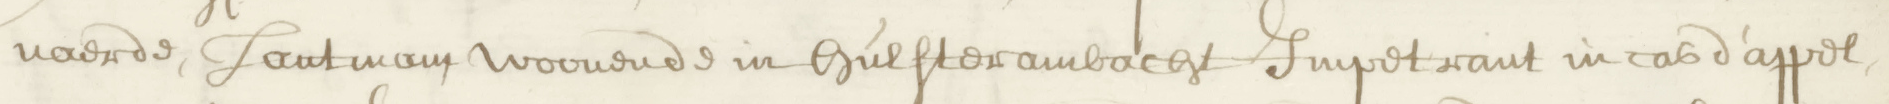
naerde, Lantman woonende in Hulsterambacht Impetrant in cas d'appel,
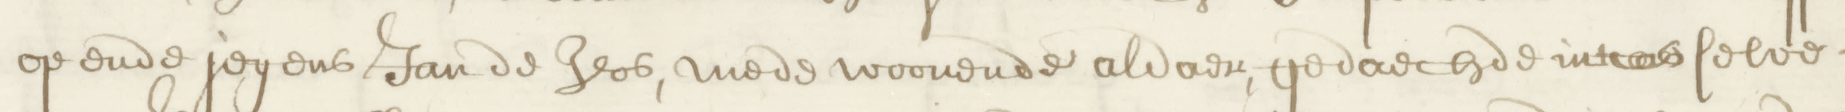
op ende jegens Jan de Vos, mede woonende aldaer, gedaechde int cas selve
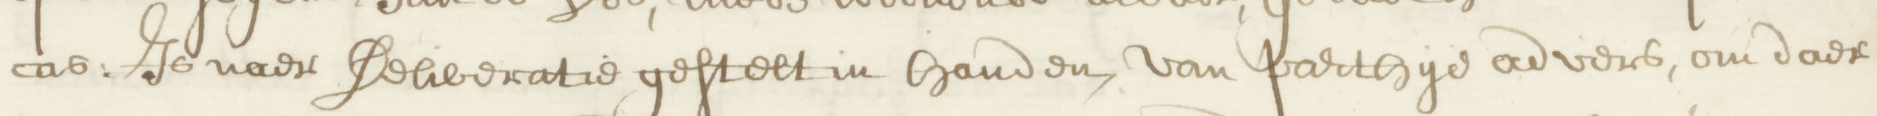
cas: Is naer Deliberatie gestelt in handen van parthije advers, om daer
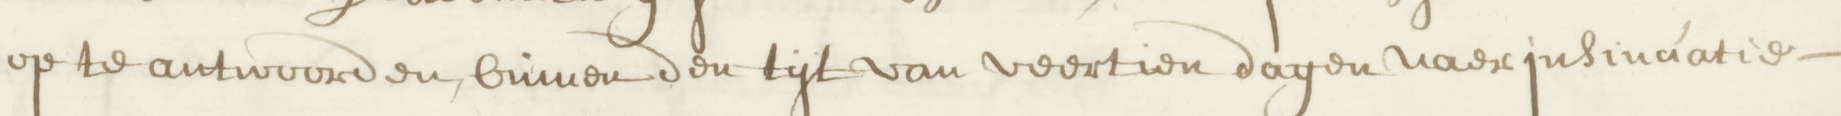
op te antwoorden, binnen den tijt van veertien dagen naer insinuatie
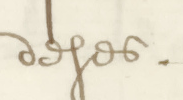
deses.
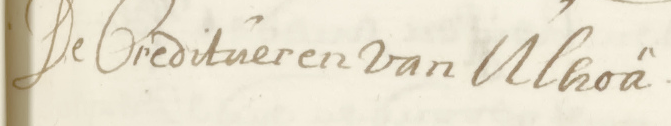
De Creditueren van Ulhoâ
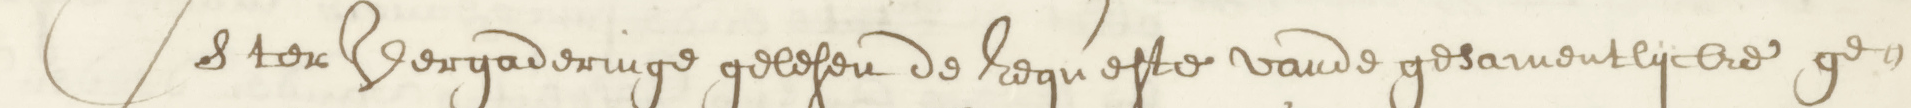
Is ter Vergaderinge gelesen de Requeste vande gesamentlijcke ge„
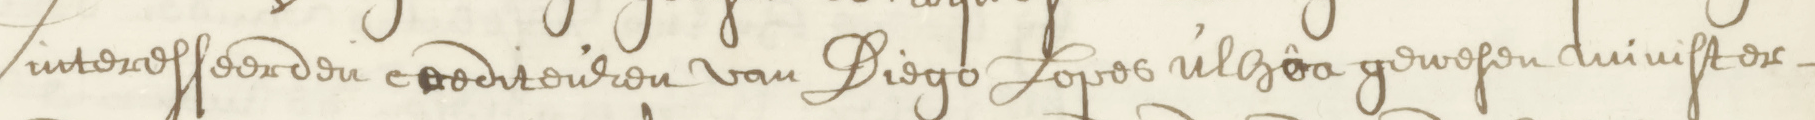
interesseerden crediteuren van Diego Lopes ulhôa gewesen minister
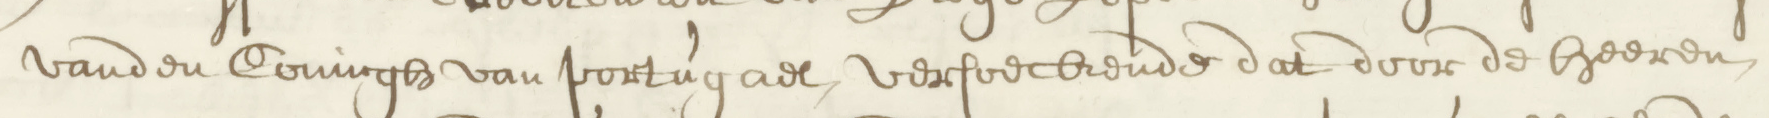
vanden Coningh van portugael, versoeckende dat door de heeren
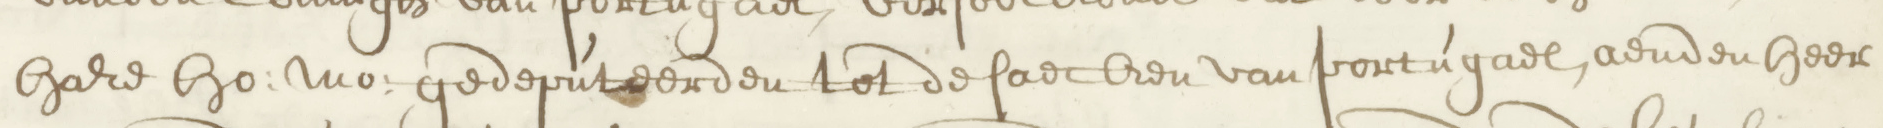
hare Ho:Mo: gedeputeerden tot de saecken van portugael, aenden heer
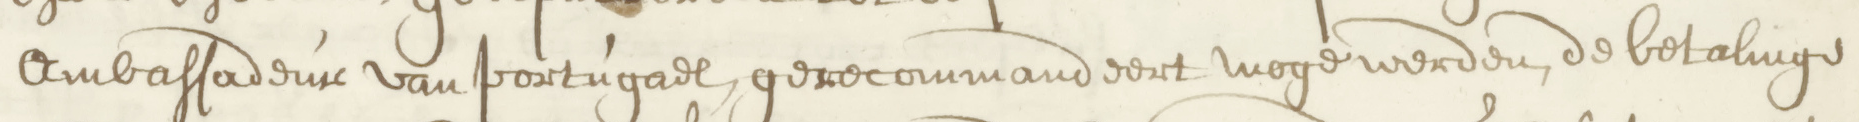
Ambassadeur van portugael, gerecommandeert moge werden de betalinge
